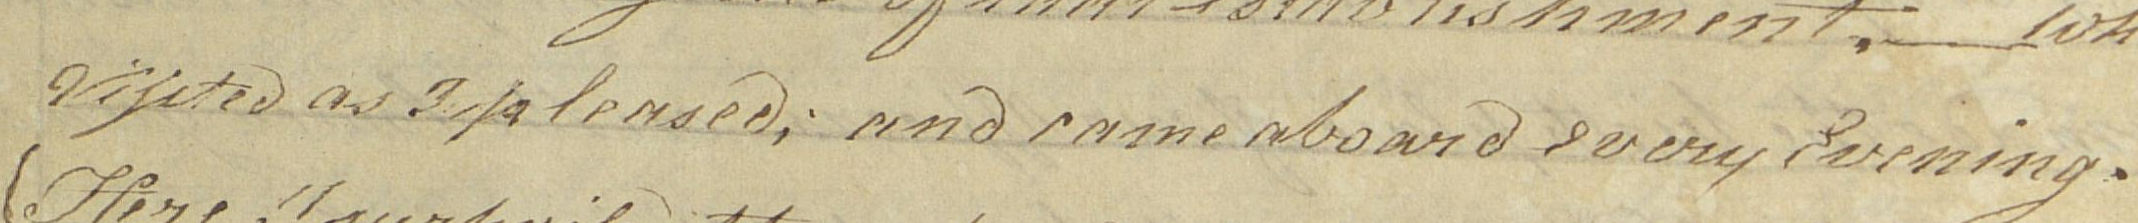visited as I pleased; and came aboard every Evening.
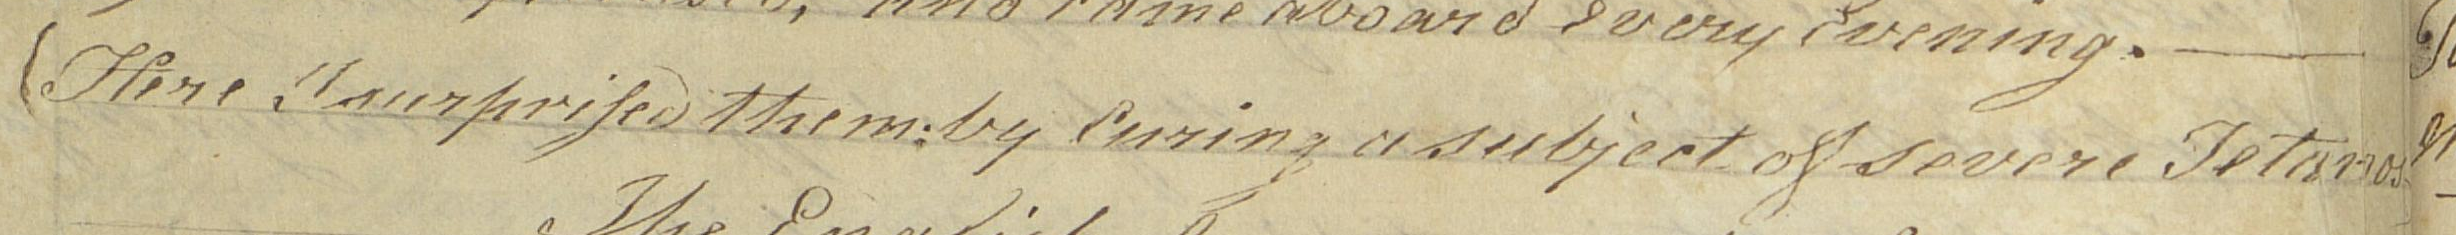(Here surprised them: by Curing a subject of severe Tetanos
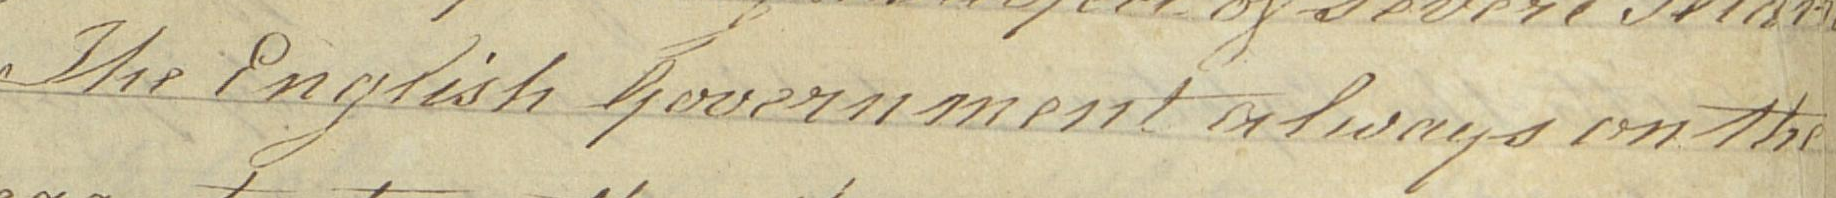The English Government always on the
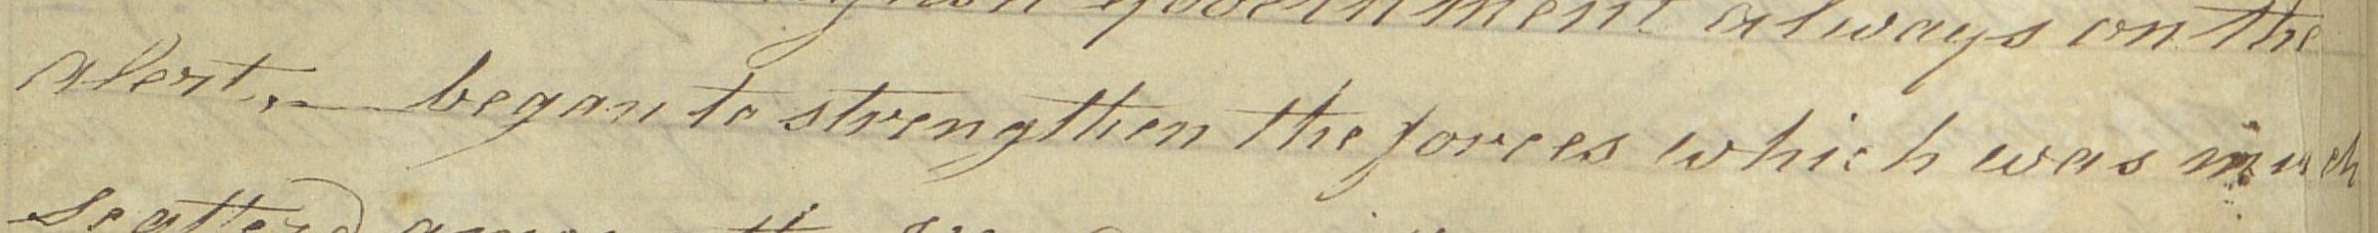alert, began to strengthen the forces which was much
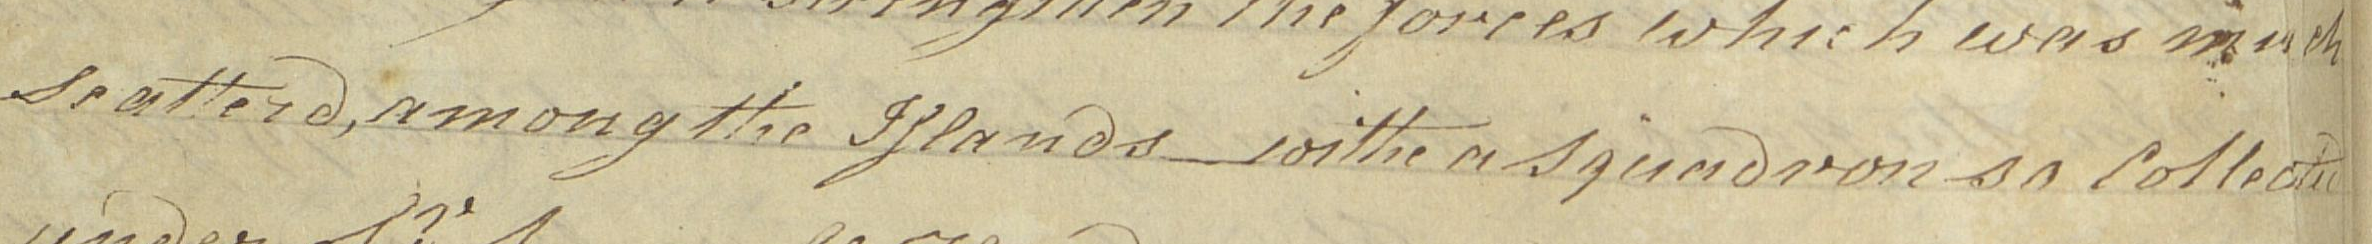scatterd among the Islands with a Squadron so Collected
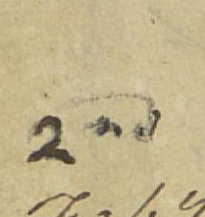2^nd
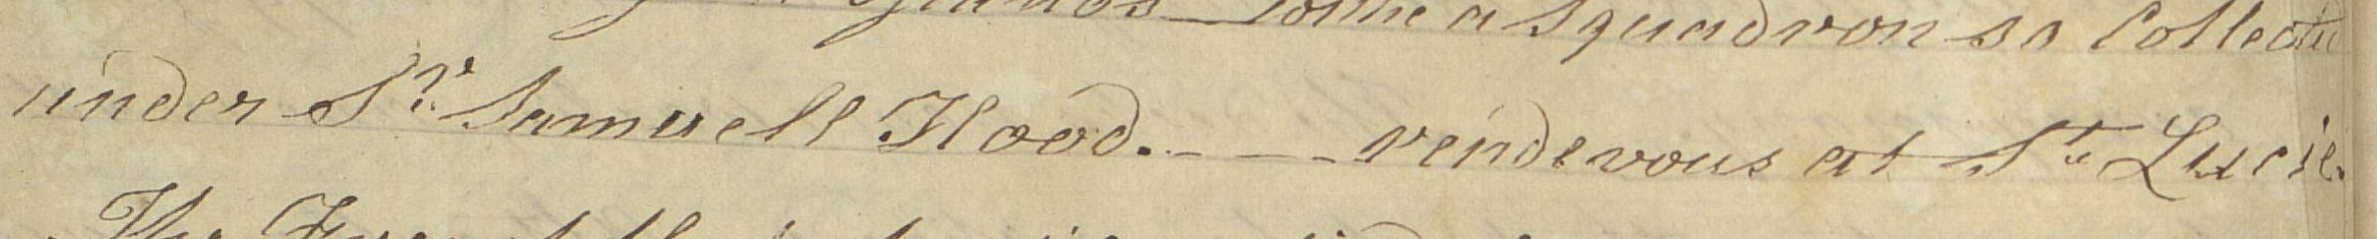uinder S^r. Samuell Hood. rendevous at S^t. Lucie.
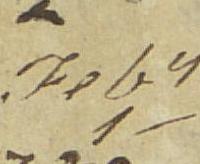Feb^y
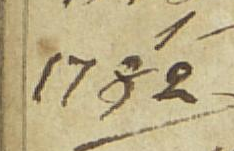1782
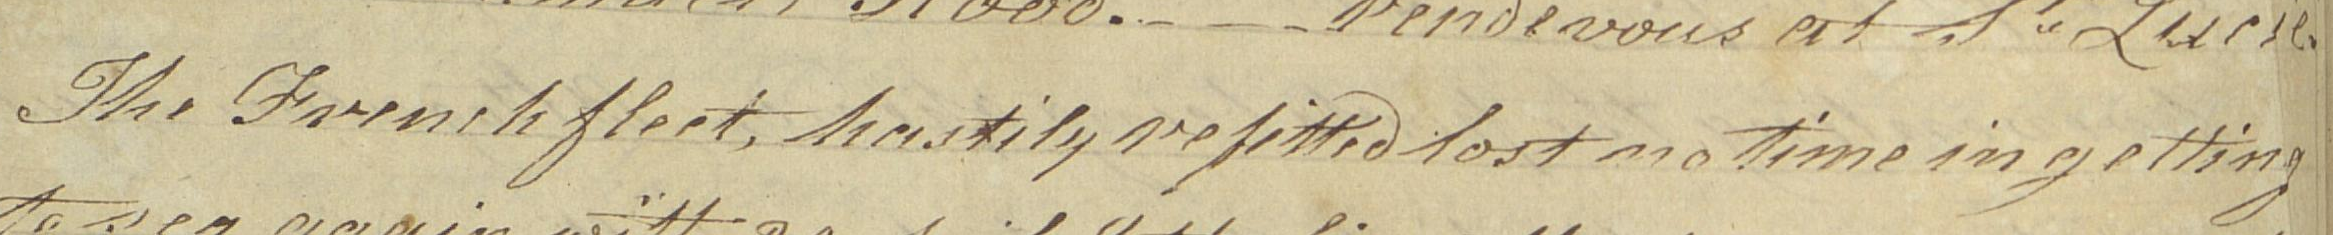The French fleet, hastily refitted lost no time in getting
